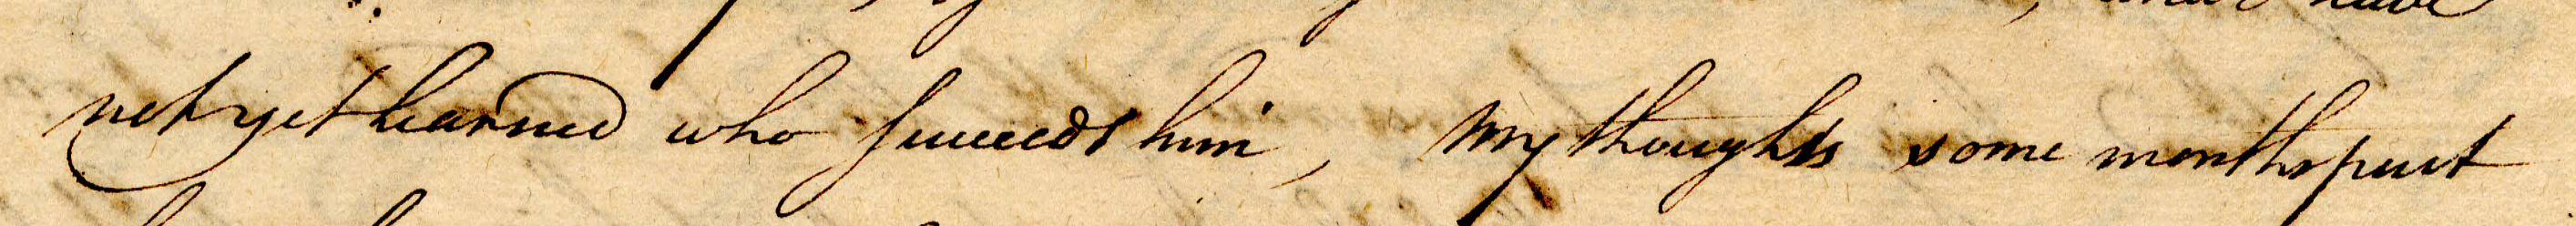not yet learned who succeeds him, my thoughts some months past
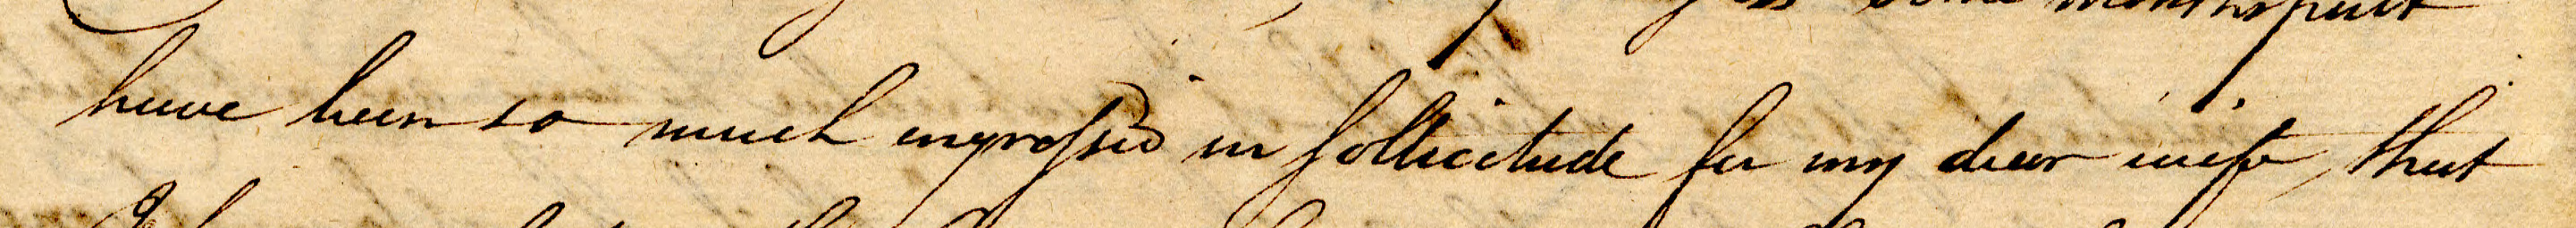have been so much engrossed in Sollicitude for my dear wife, that
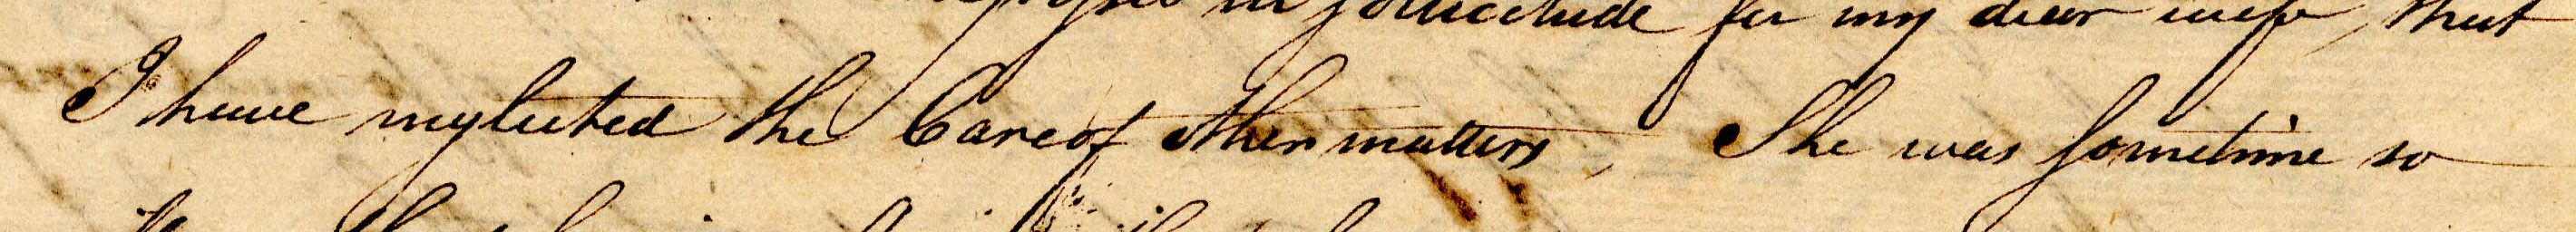I have neglected the Care of other matters. She was Sometime so
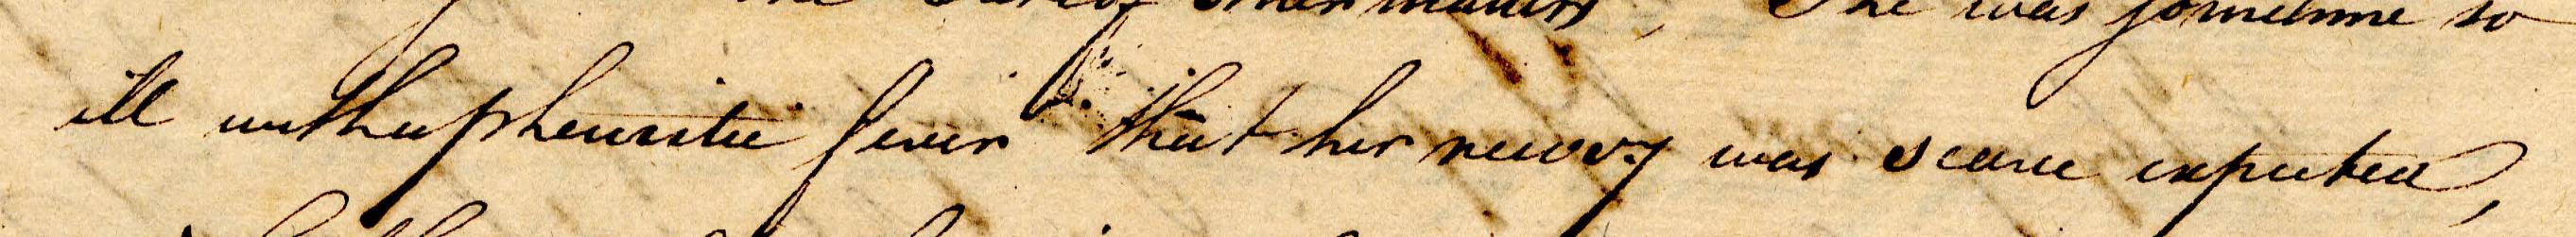ill with a pleuritic fever that her recovery was scare expected,
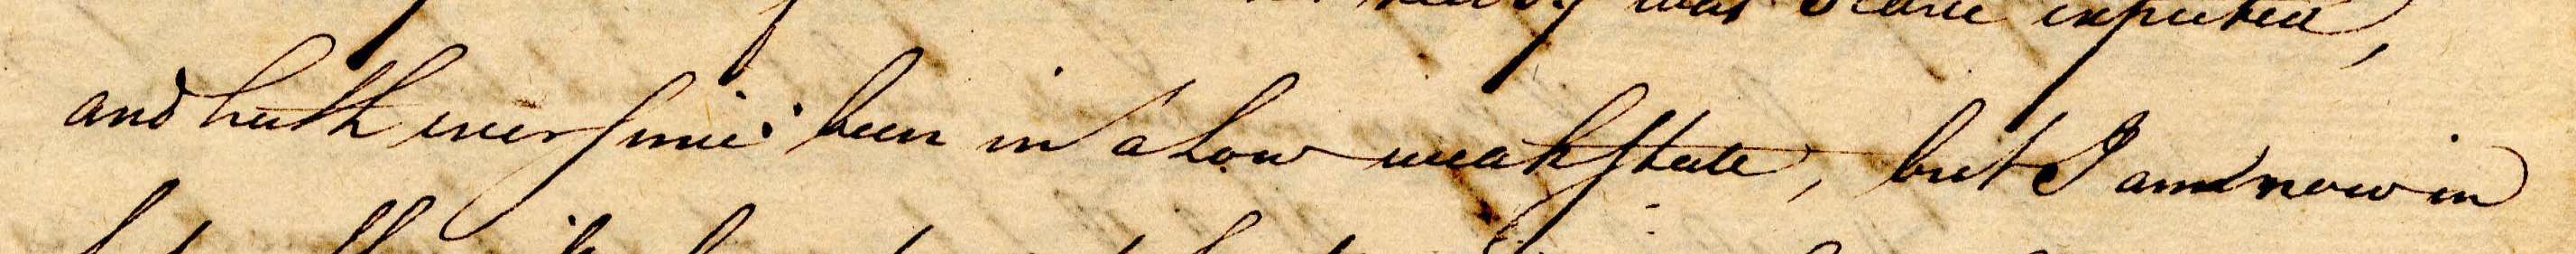and hath ever since been in a Low weak state, but I am now in
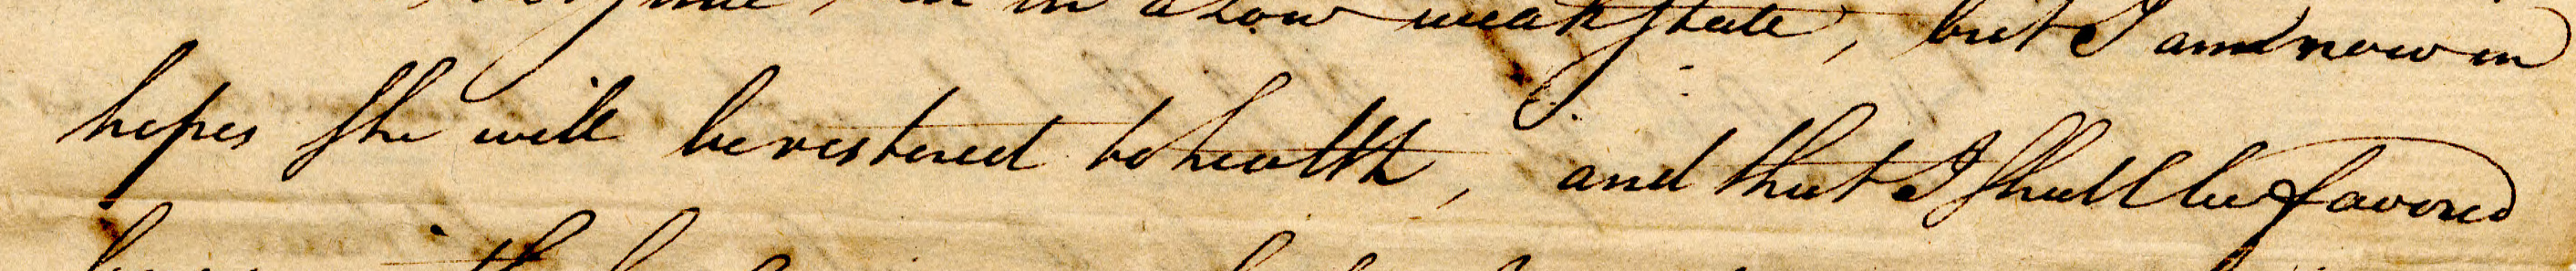hopes she will be restored to health, and that I shall be favored
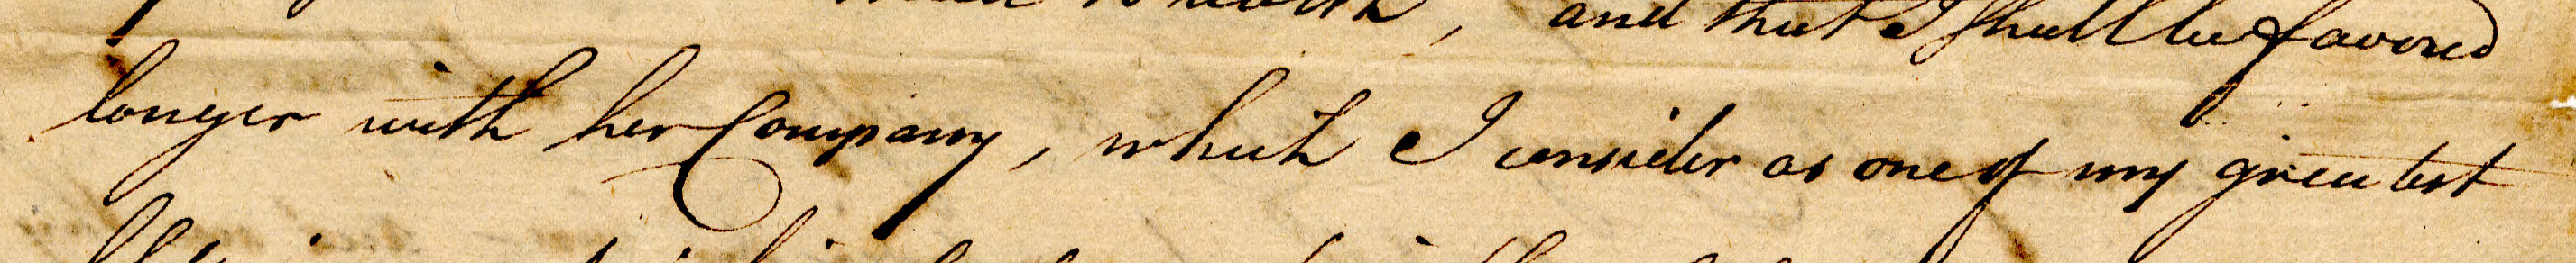longer with her Company, which I consider as one of my greatest
